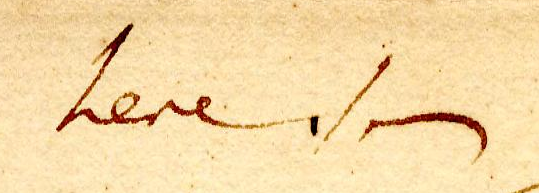herein
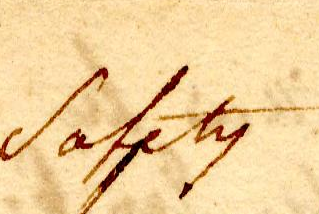Safety
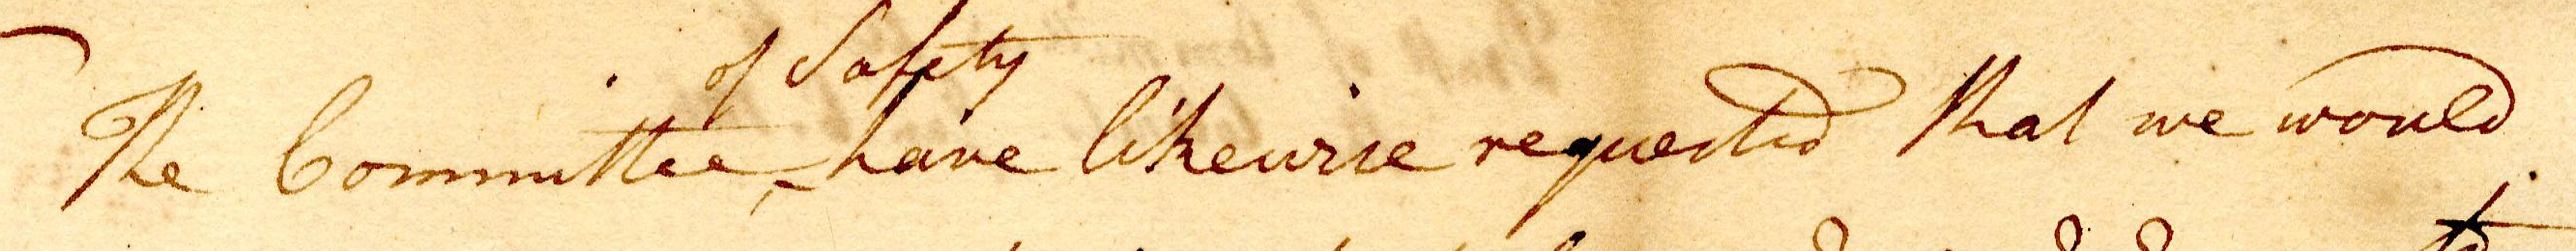The Committee ^ have likewise requested that we would
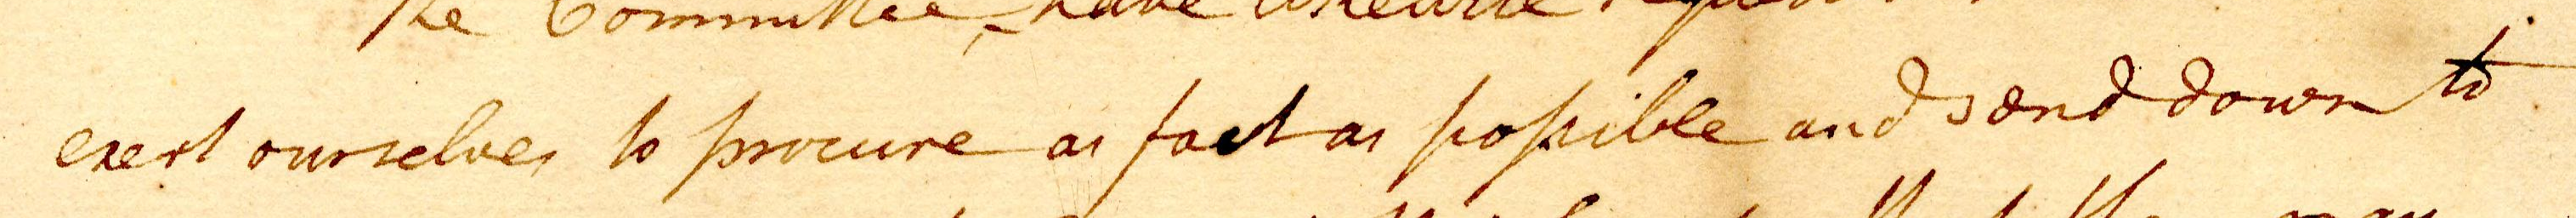exert ourselves to procure as fact as possible and send down to
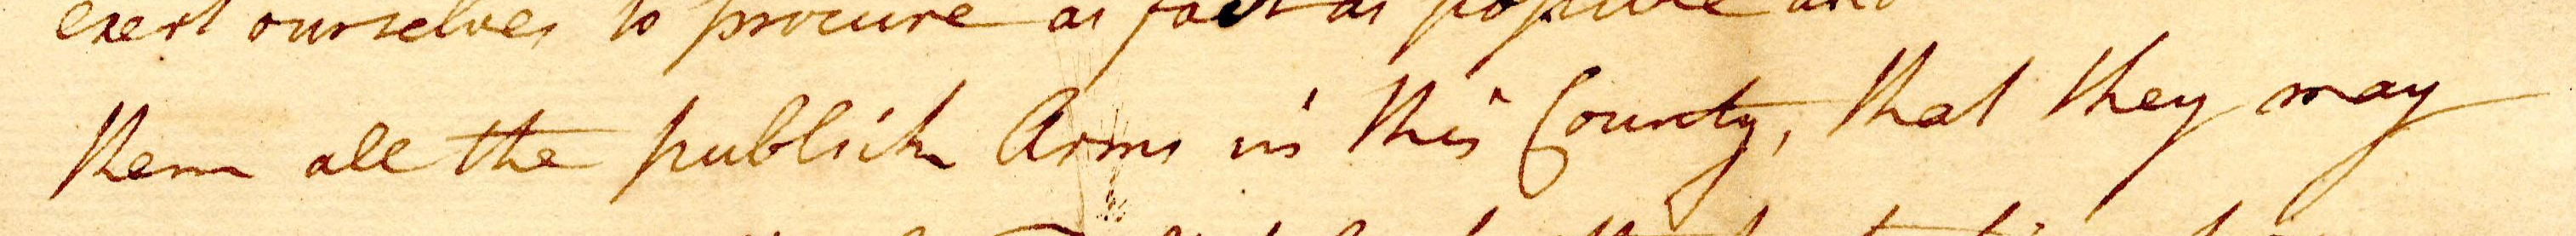tem all the publick Arms in this County, that they may
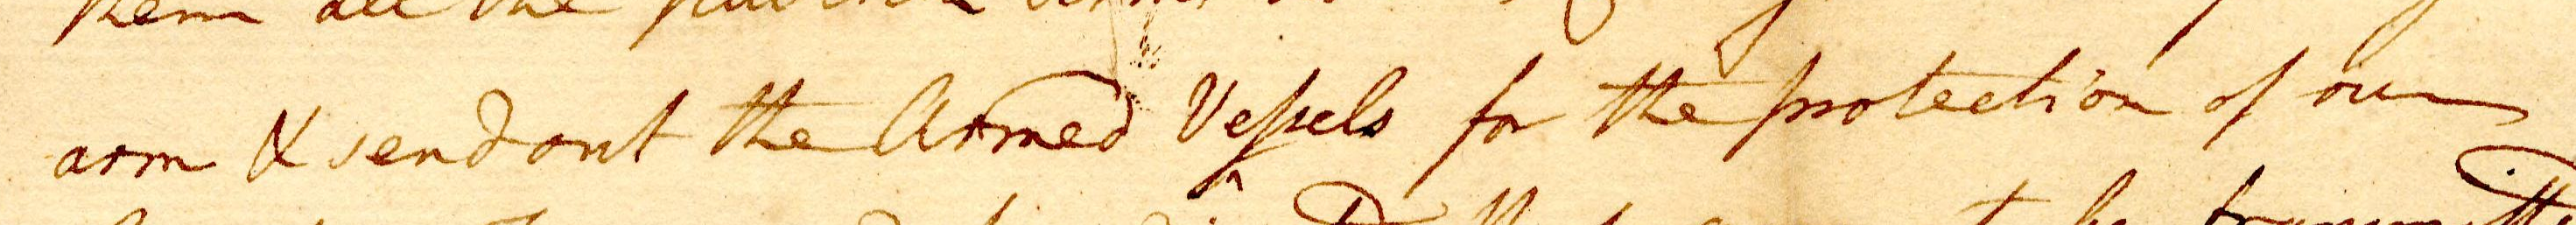arm & send out the Armed Vessels for the protection of our
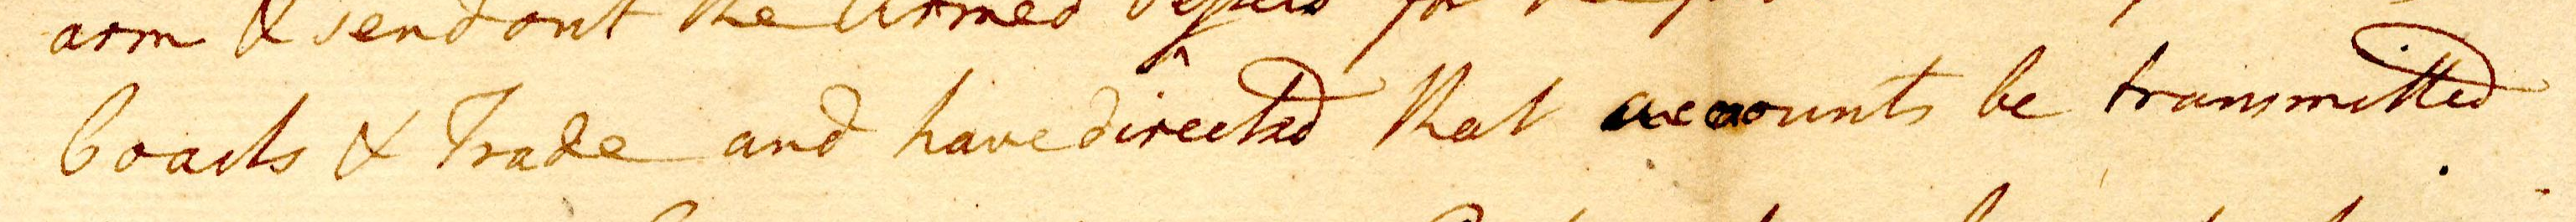boats & Trade and have directed that accounts be transmitted
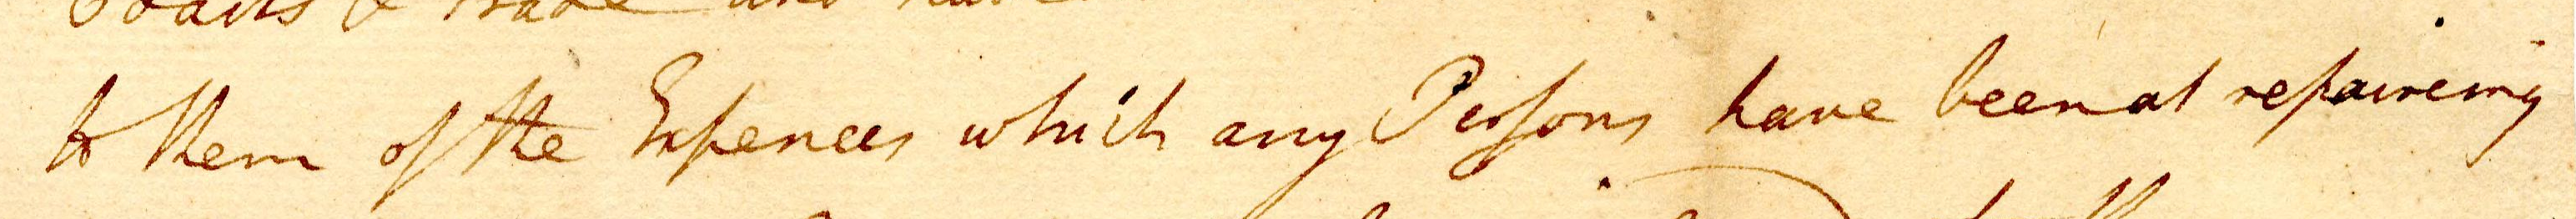to them of the Expences which any Persons have been at repairing
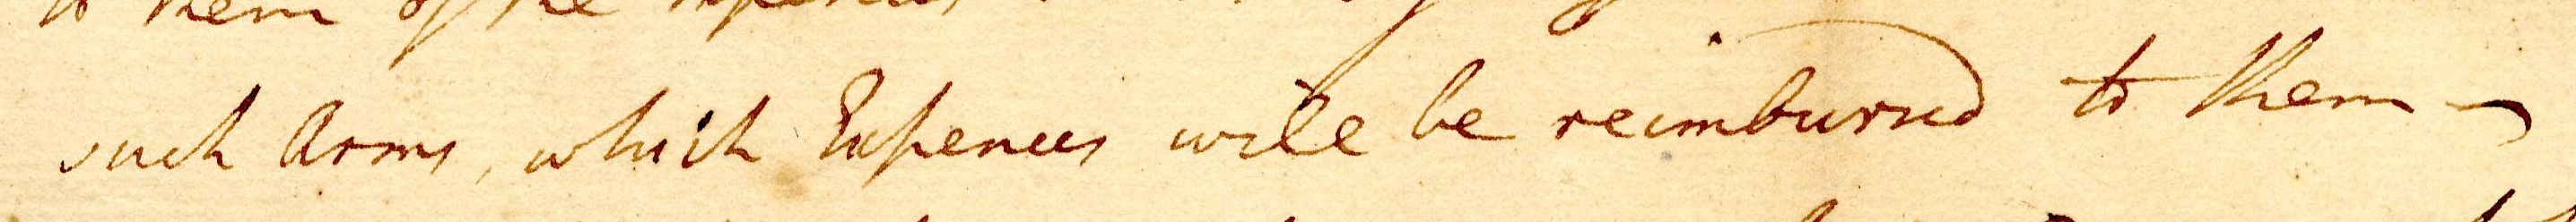such Arms, which Expences will be reimbursed to them.
